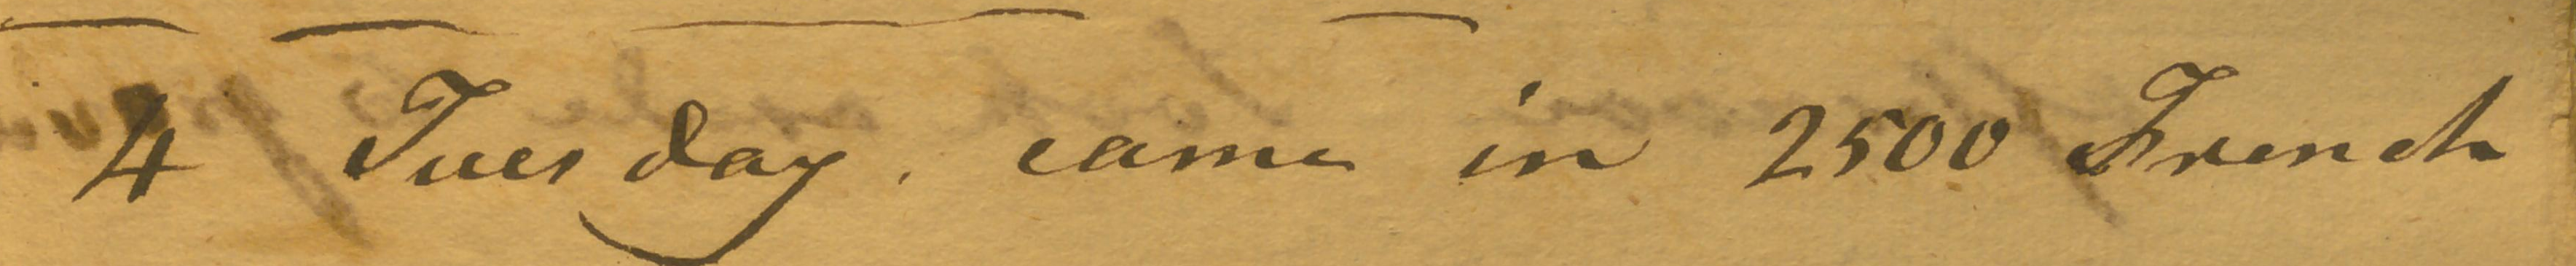4 Tuesday. came in 2500 French
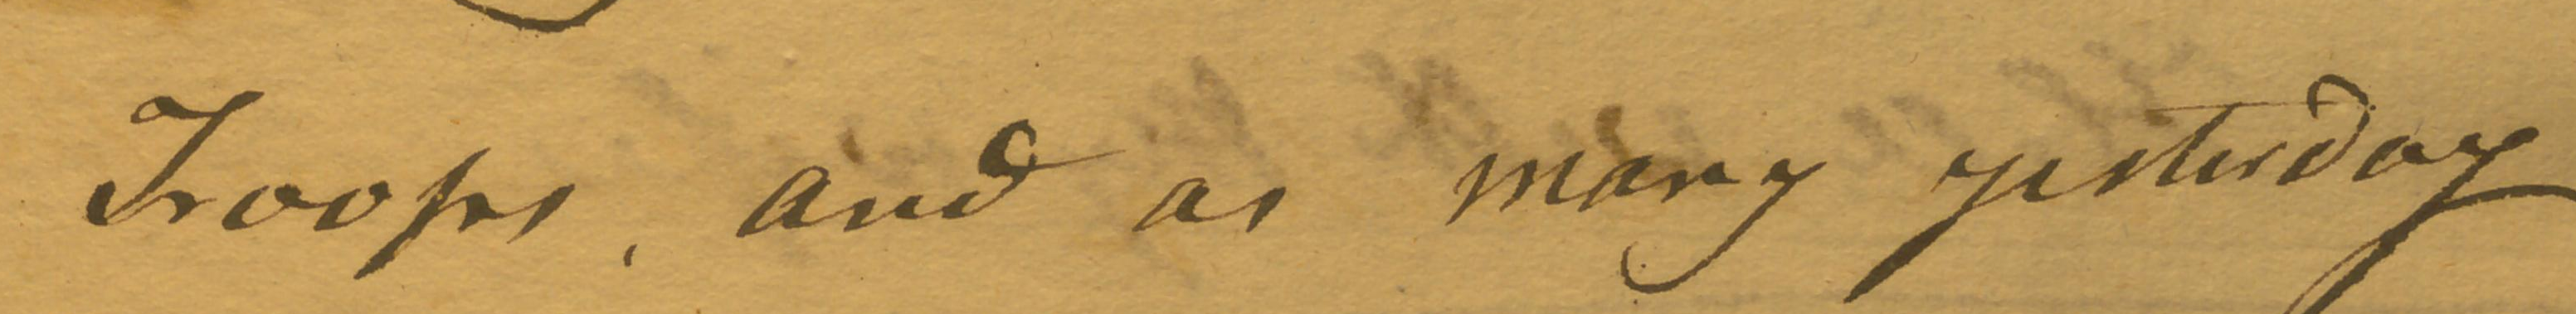Troops, and as Many yesterday
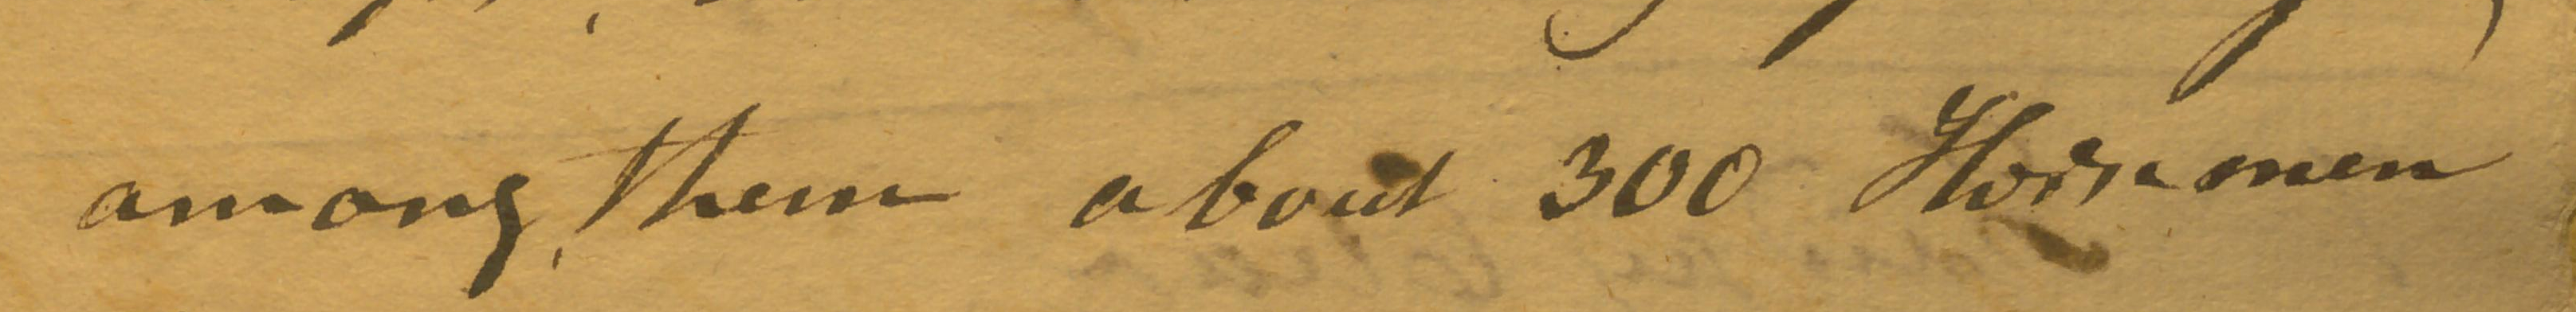among them about 300 Horsemen
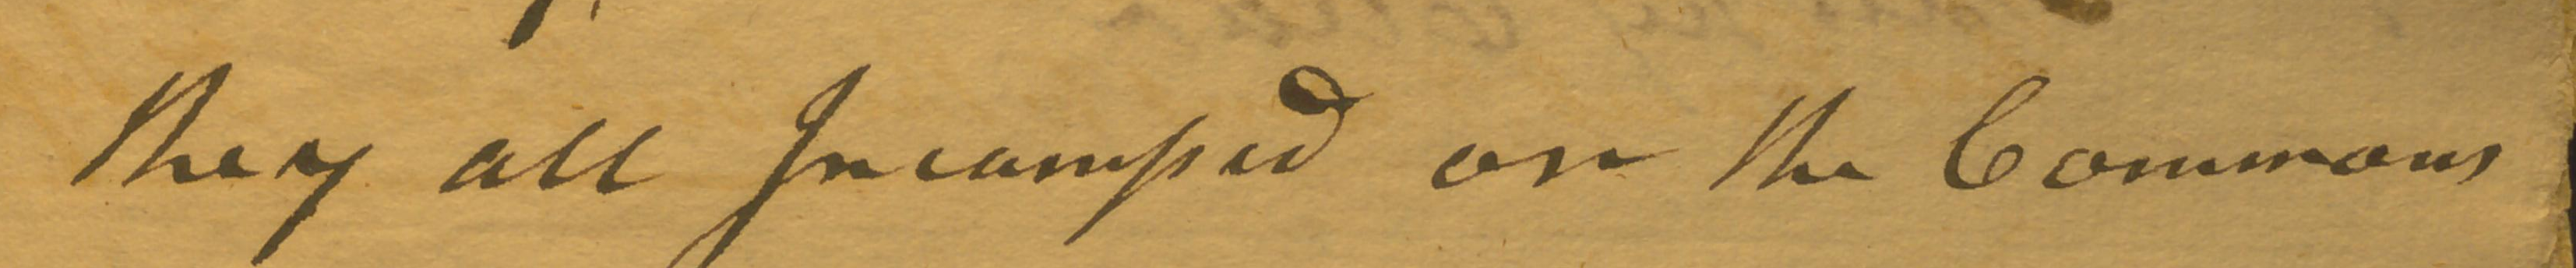they all Incamped on the Commons
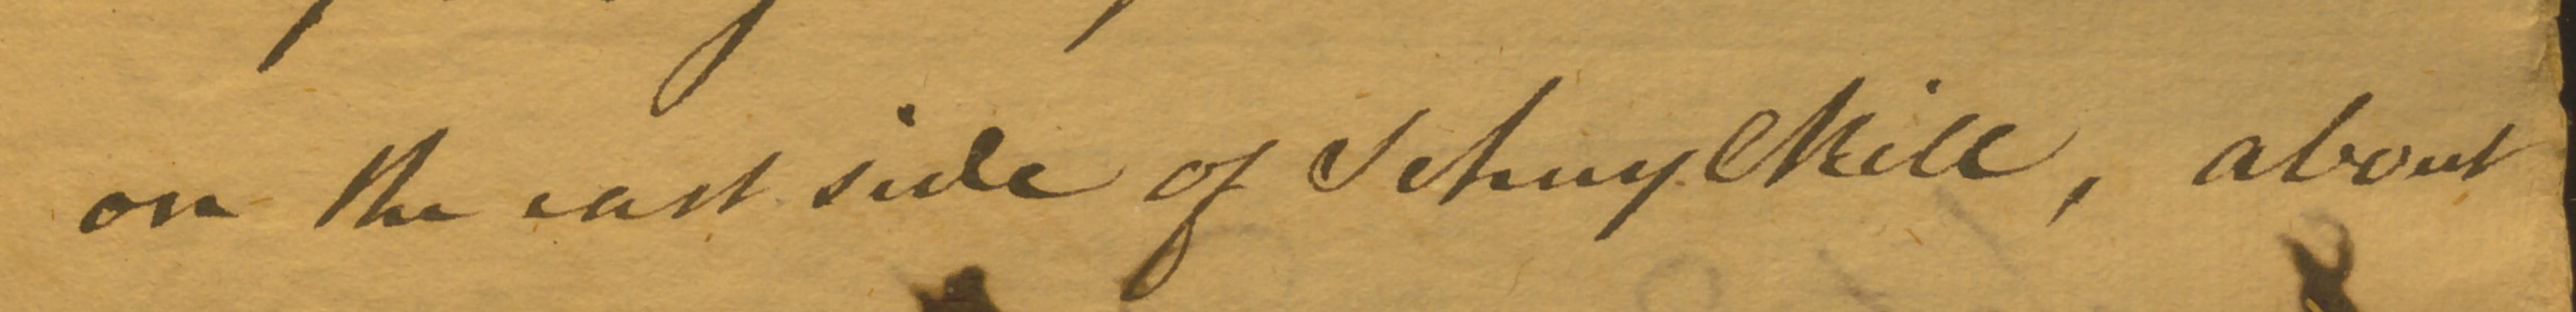on the east side of Schuylkill, about
